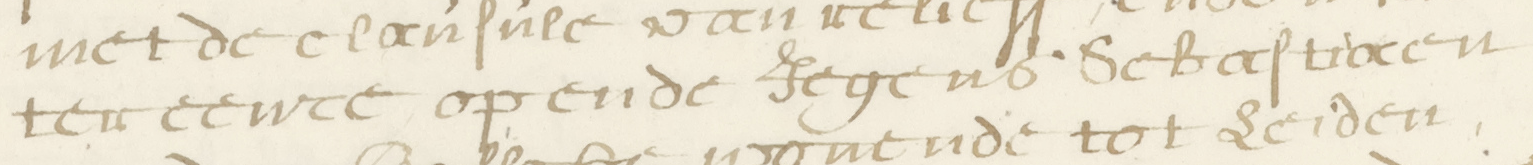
ter eenre op ende Jegens Sebastiaen
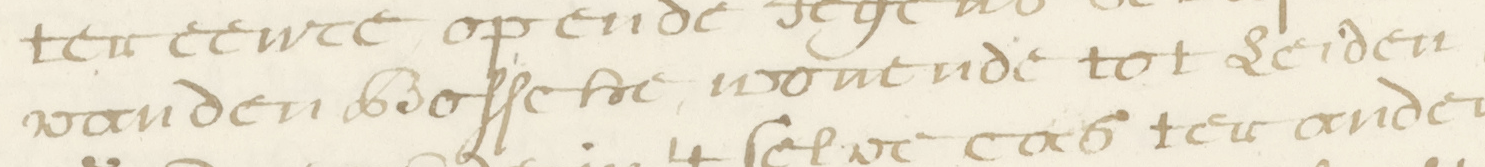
van den Bossche, wonende tot Leiden,
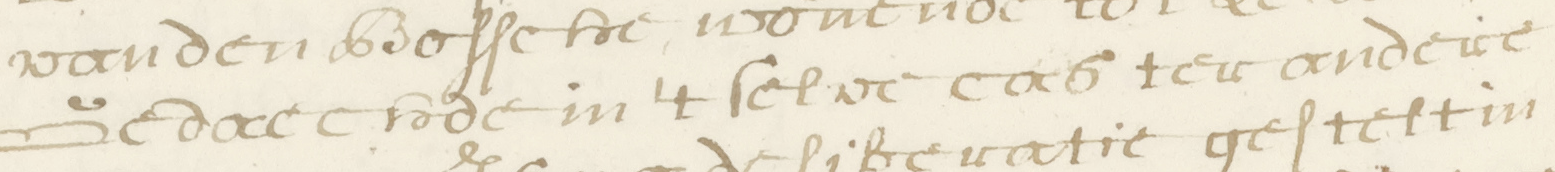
Gedaechde in 't selve cas ter andere
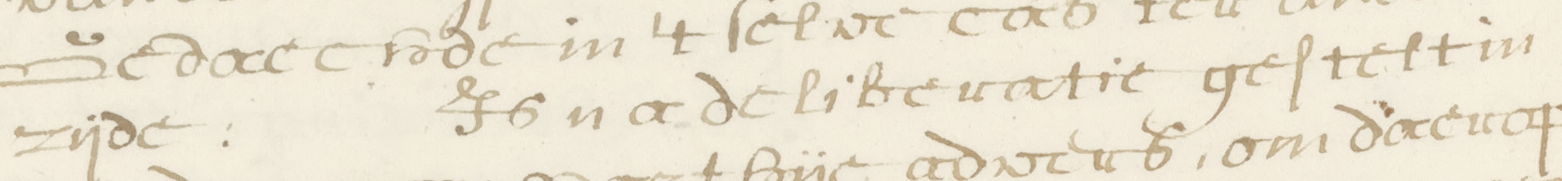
zijde: Is na deliberatie gestelt in
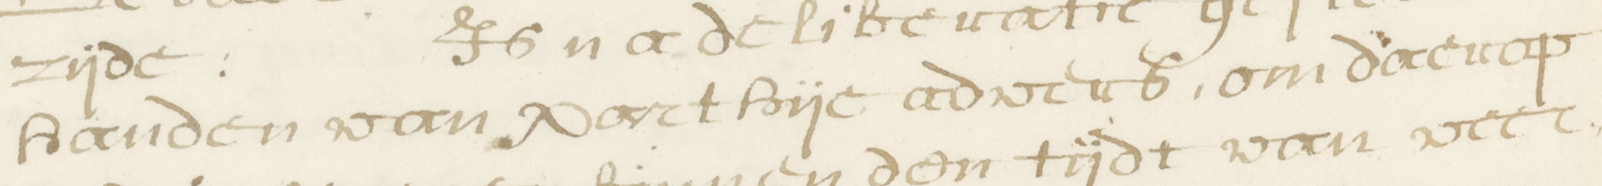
handen van Parthije advers, om daerop
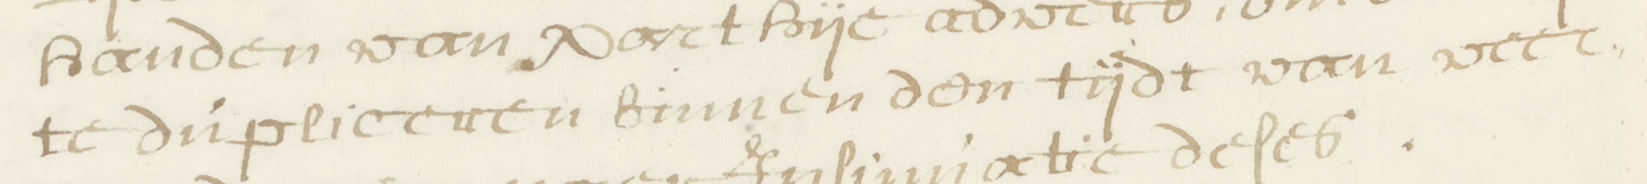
te dupliceren binnen den tijdt van veer,,
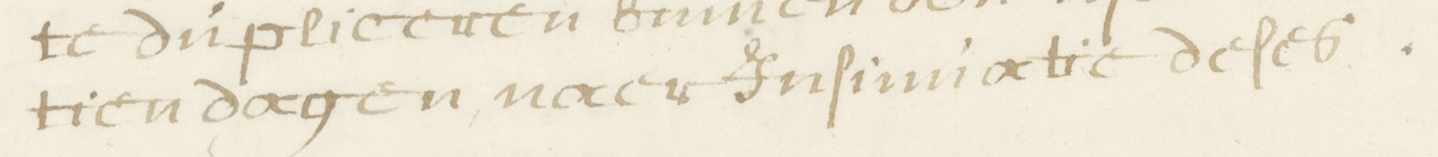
tien dagen naer Insinuatie deses.
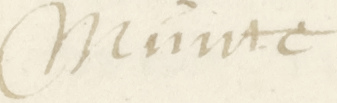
Munte
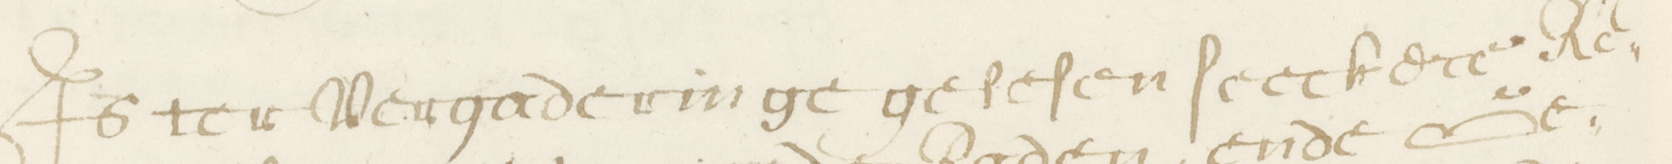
Is ter Vergaderinge gelesen seeckere Re,,
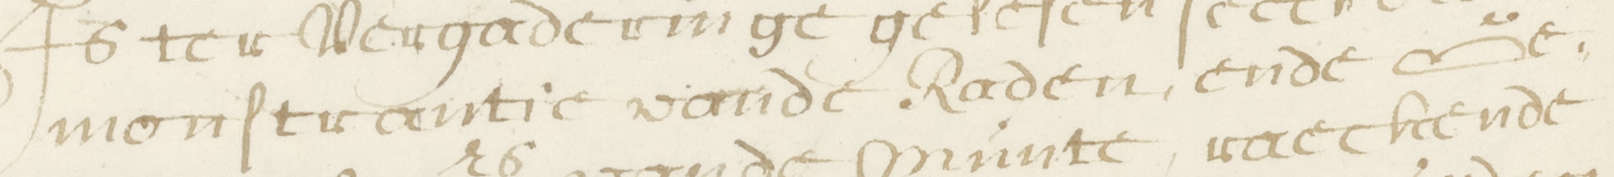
monstrantie vande Raden, ende Ge,,
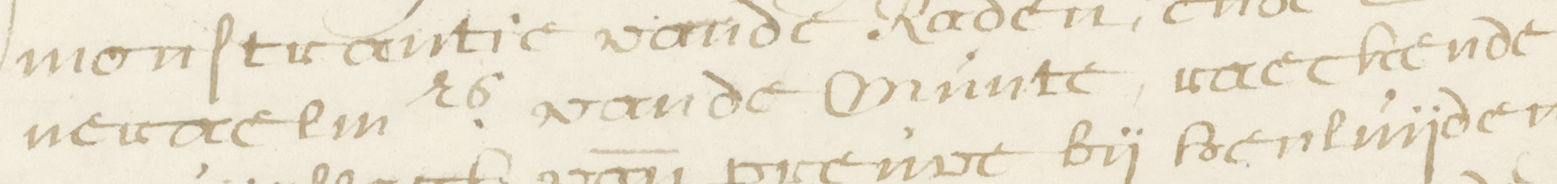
neraelmrs. vande Munte, raeckende
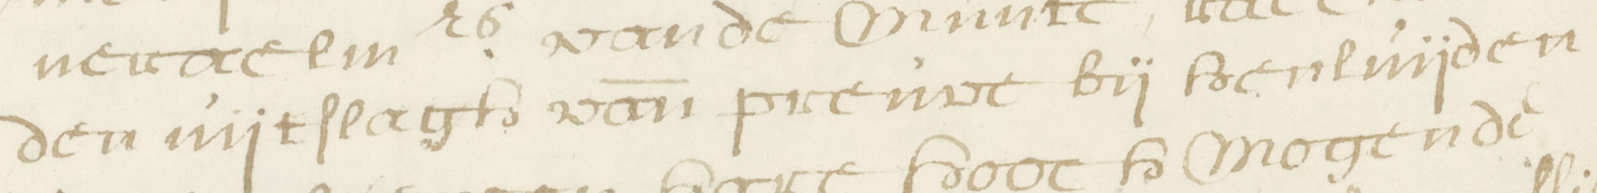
den uijtslagh van preuve bij henluijden
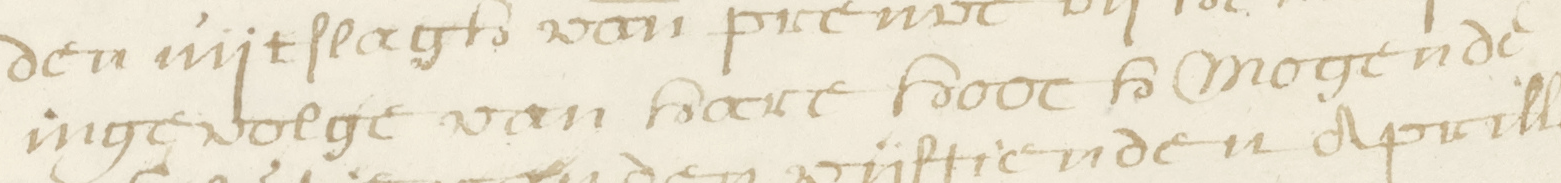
ingevolge van hare hooch mogende
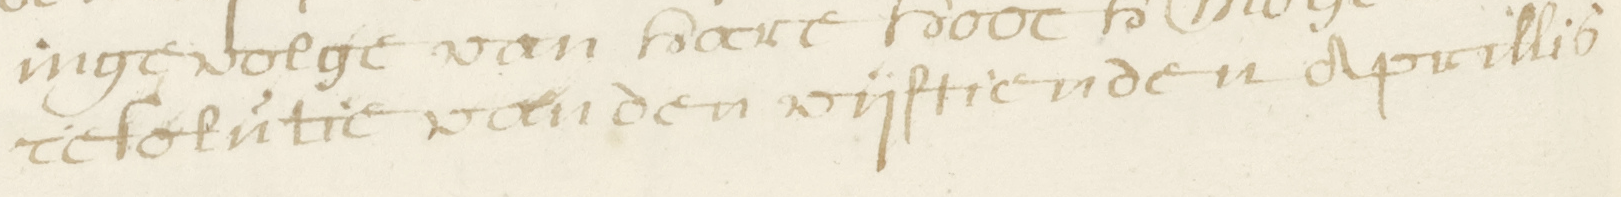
resolutie van den vijftienden Aprillis
